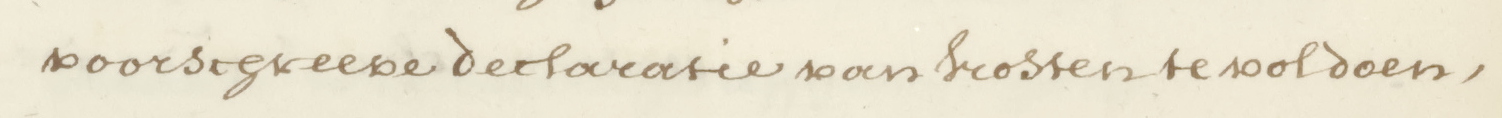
voorschreeve declaratie van kosten te voldoen,
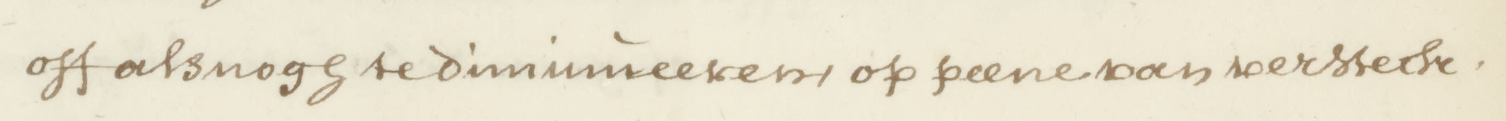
off alsnogh te diminueeren, op peene van versteck,
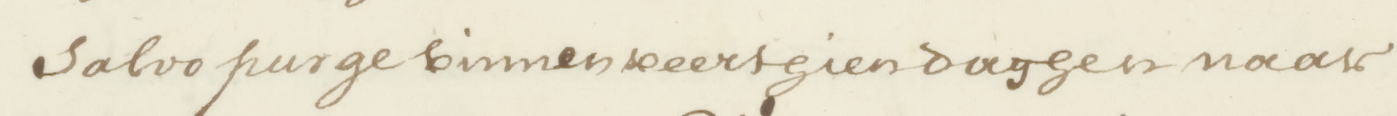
salvo purge binnen veerthien daghen naar
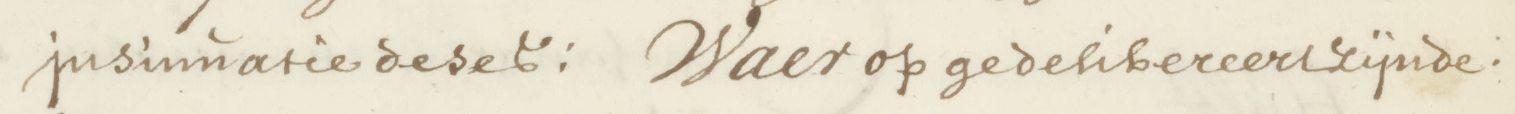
insinuatie deses: Waer op gedelibereert zijnde,
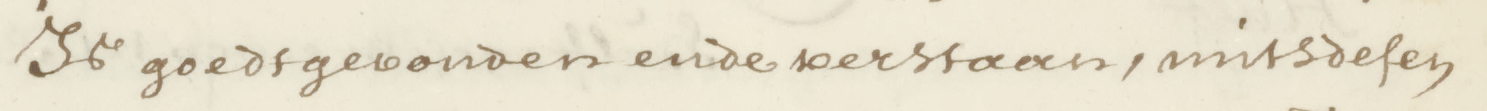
Is goedt gevonden ende verstaen, mitsdesen
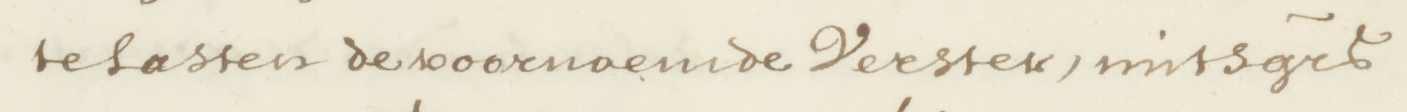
te lasten de voornoemde Verster, mitsgrs
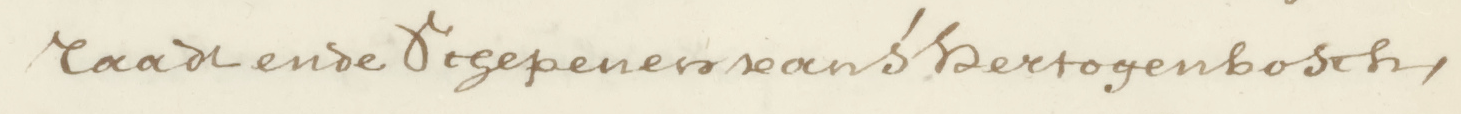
raadt ende Schepenen van s'Hertogenbosch,
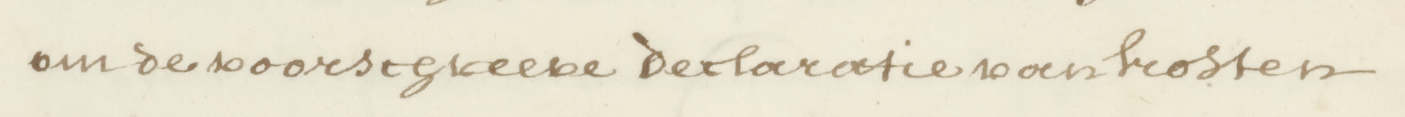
om de voorschreeve declaratie van kosten
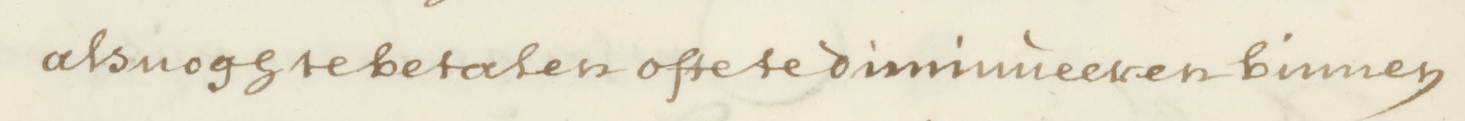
alsnogh te betalen ofte diminueeren binnen
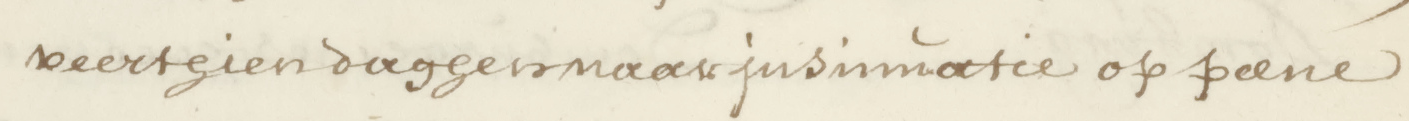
veerthien daghen naar insinuatie op peene
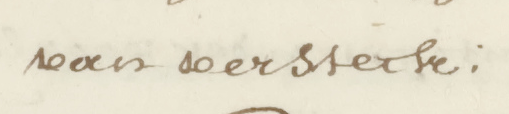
van versteck:
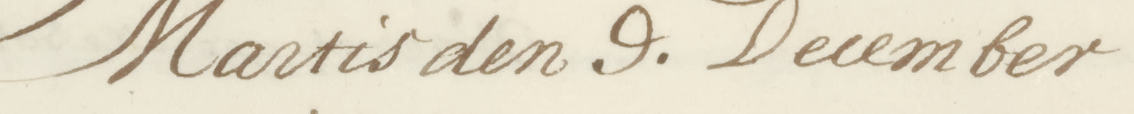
Martis den 9. December
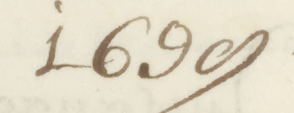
1698
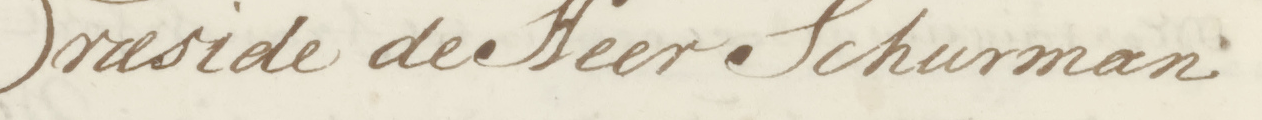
Preside de Heer Schurman
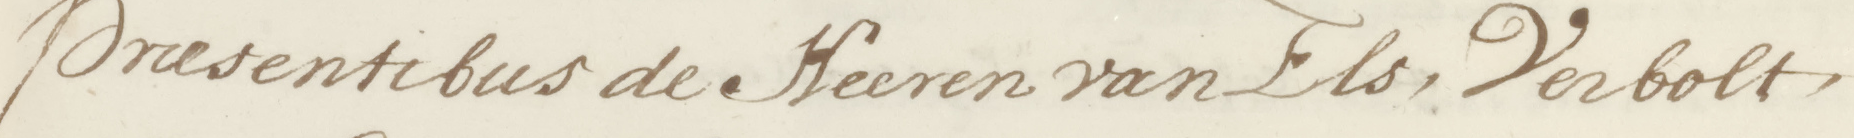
Presentibus de Heeren van Els, Verbolt,
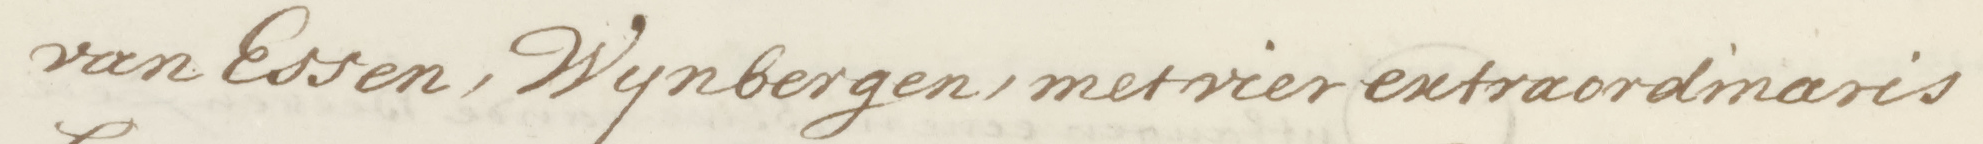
van Essen, Wynbergen, met vier extraordinaris
